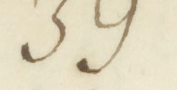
39
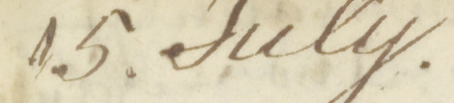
15. Julij.
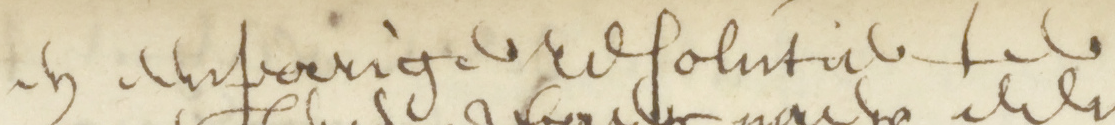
en eenparige resolutie te
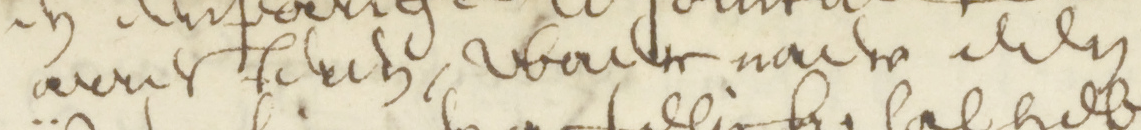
arresteren, waer naer een
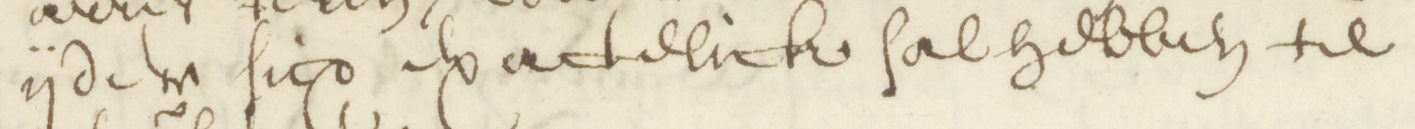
ijder sich exactelick sal hebben te
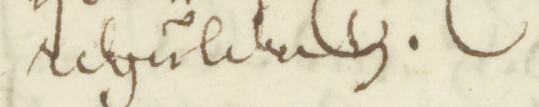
reguleren.
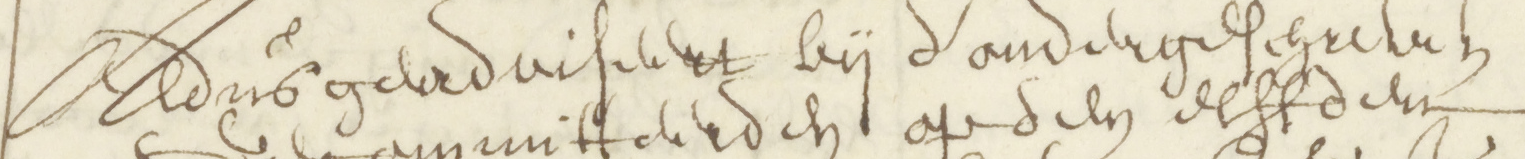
Aldus geadviseert bij d'ondergeschreven
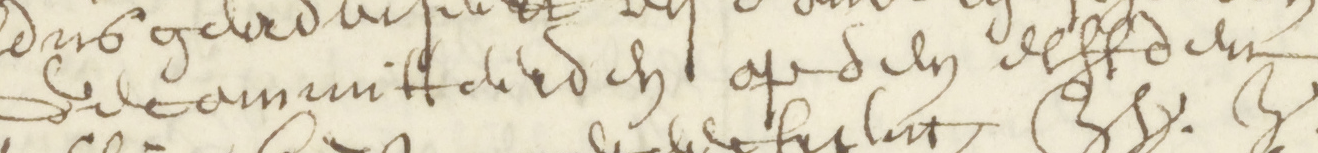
Gecommitteerden opden elffden
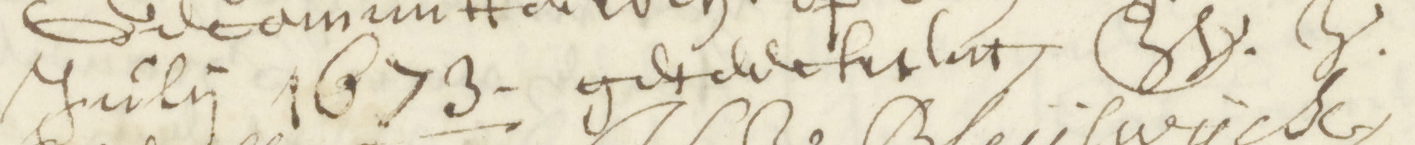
Julij 1673. geteeckent. W.J.
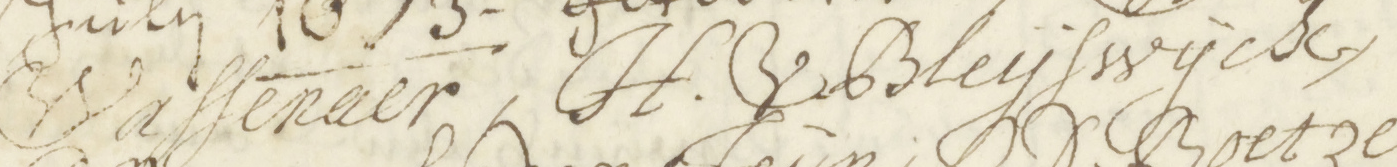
Wassenaer, H.V. Bleijswijck,
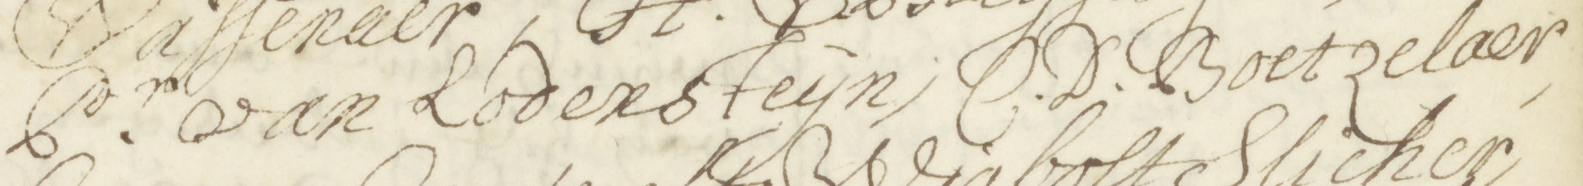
Pr van Lodensteijn, C.D. Boetzelaer
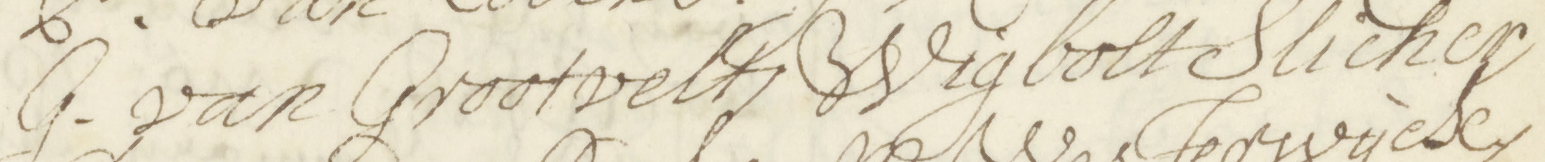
G. van Grootvelt, Wigbolt Slicher
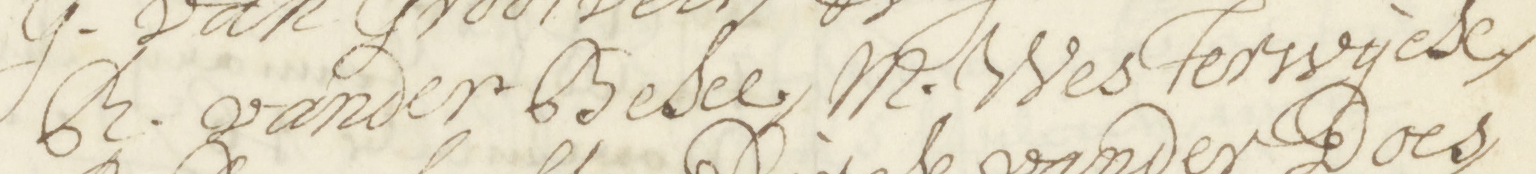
R. vander Besel, M. Westerwijck,
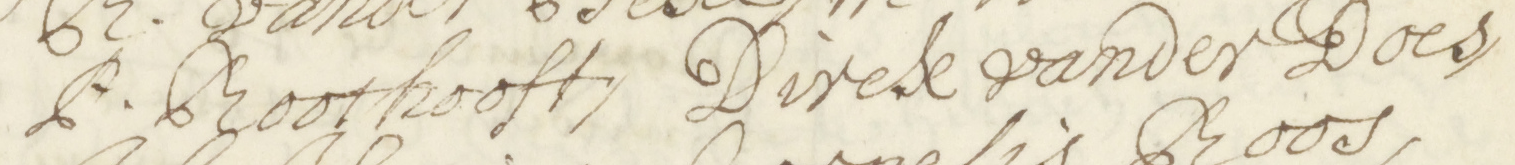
P. Roothooft, Dirck vander Does,
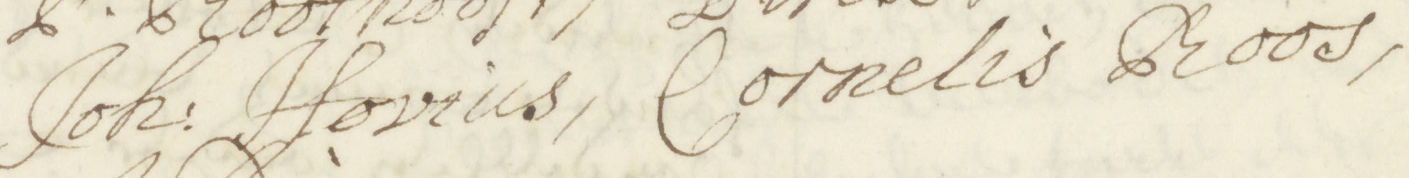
Joh: Hovius, Cornelis Roos,
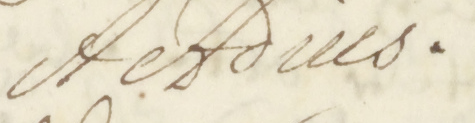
A Adius.
